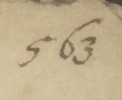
563
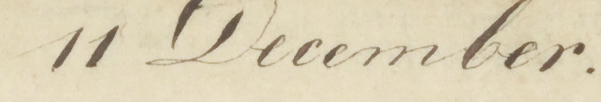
11 December.
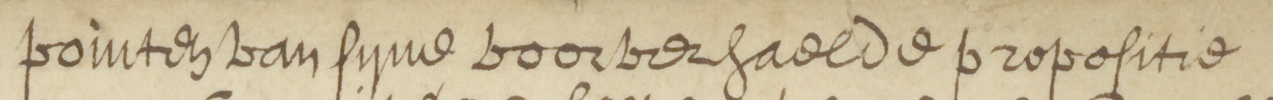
pointen van syne voorverhaelde propositie
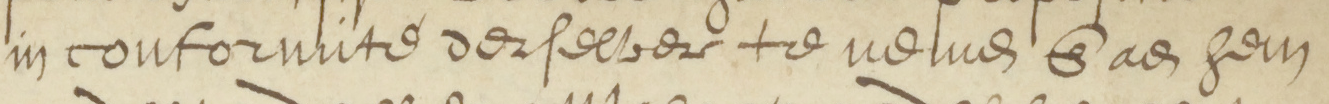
in conformité derselver te nemen & aen hem
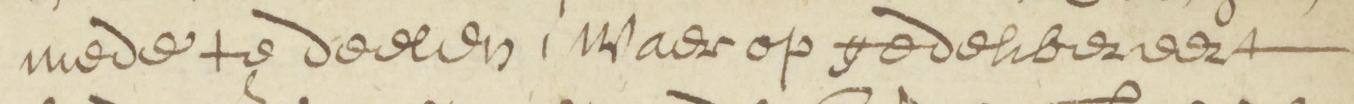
mede te deelen. Waer op gedelibereert
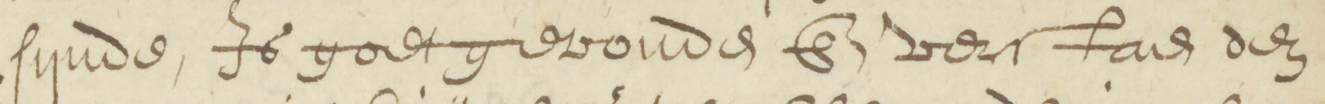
synde, Is goetgevonden & verstaen den
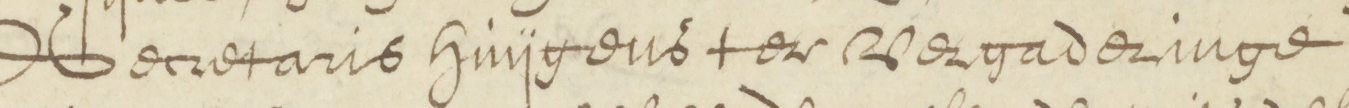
Secretaris Huijgens ter Vergaderinge
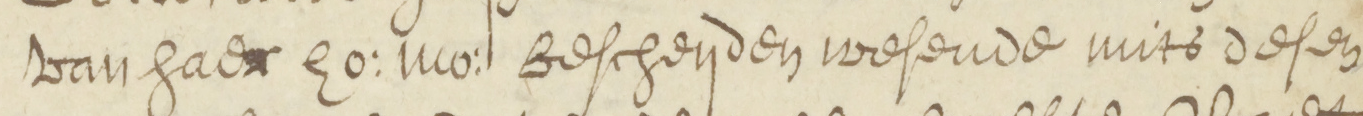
van haer ho:mo: bescheyden wesende mits desen
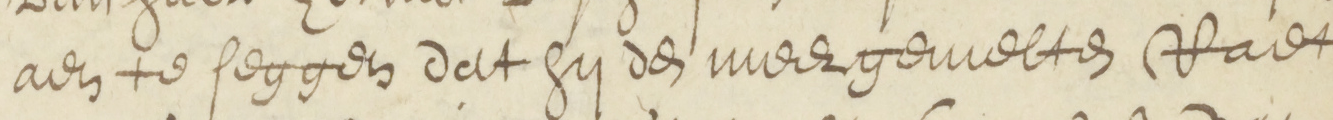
aen te seggen dat hy den meergemelten Raet
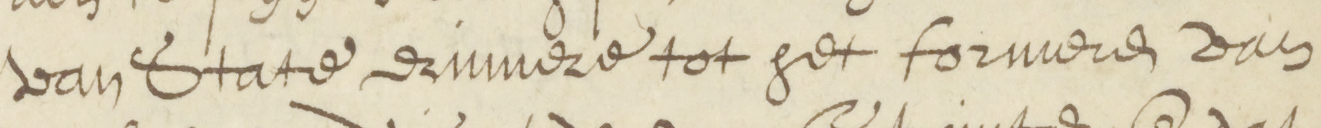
van State erinnere tot het formeren van
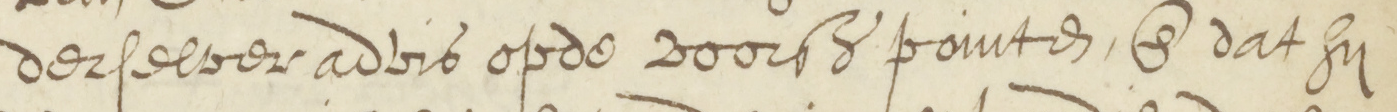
derselver advis opde voors pointen, & dat hy
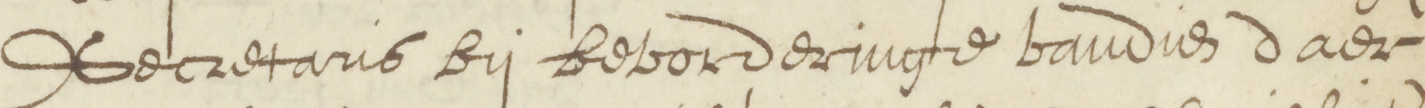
Secretaris bij bevorderinge vandien daer
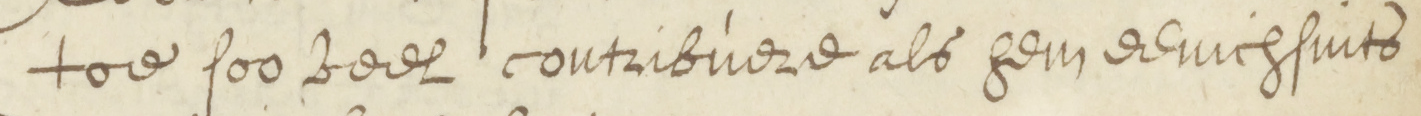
toe soo veel contribuere als hem eenichsints
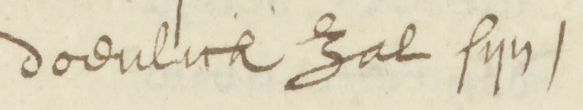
doenlick zal syn.
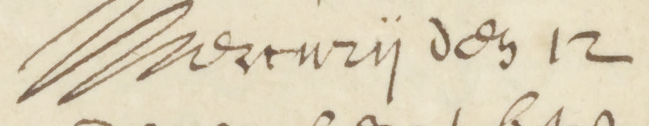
Mercurij den 12
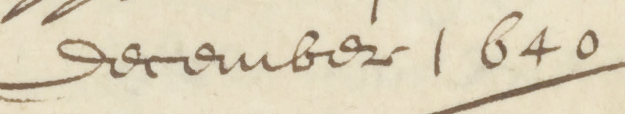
December 1640
